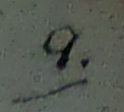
9.
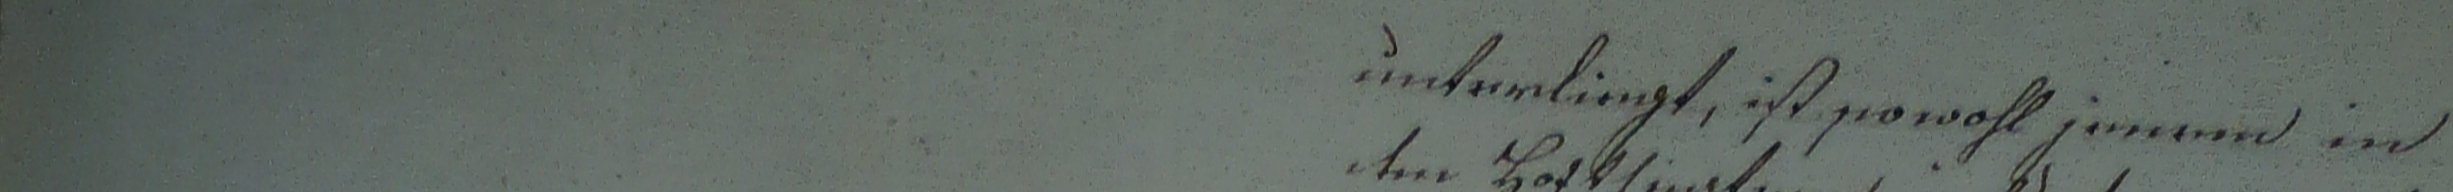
unterliegt, ist sowohl jenem in
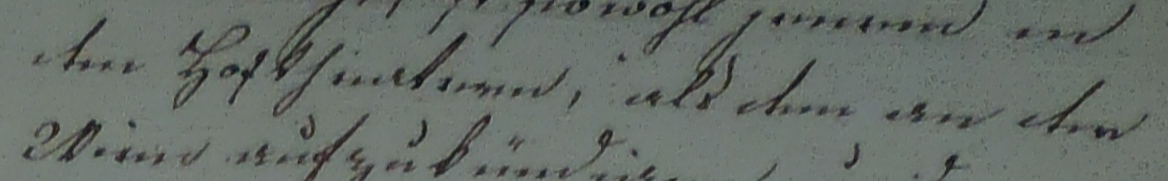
den Hoftheatern, als dem an der
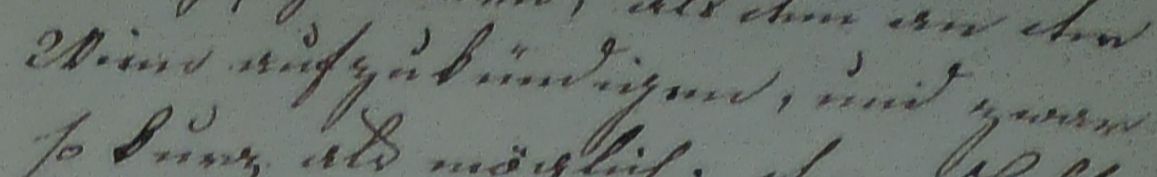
Wien aufzukündigen, und zwar
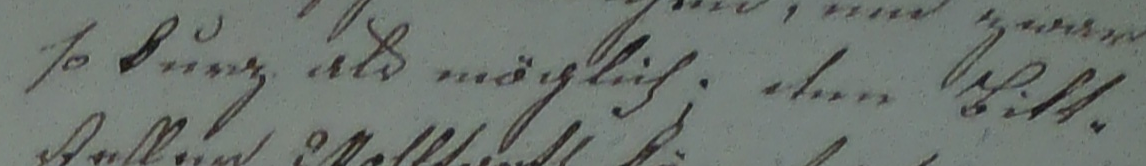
so kurz als möglich; dem Bitt¬
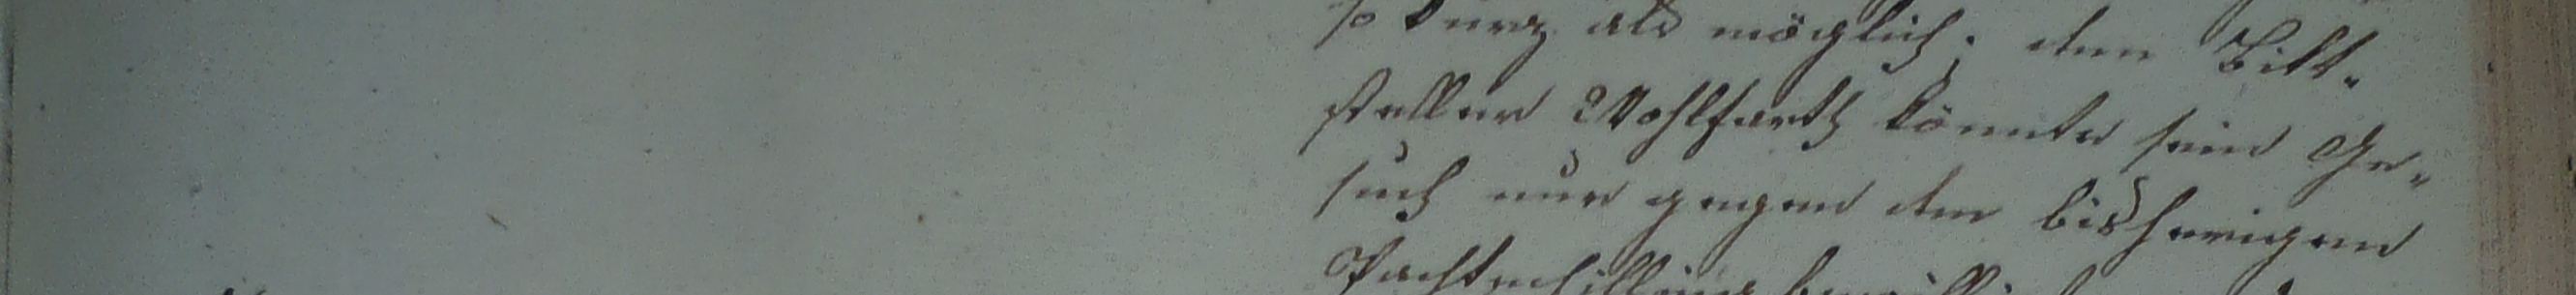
steller Wohlfarth könnte sein Ge¬
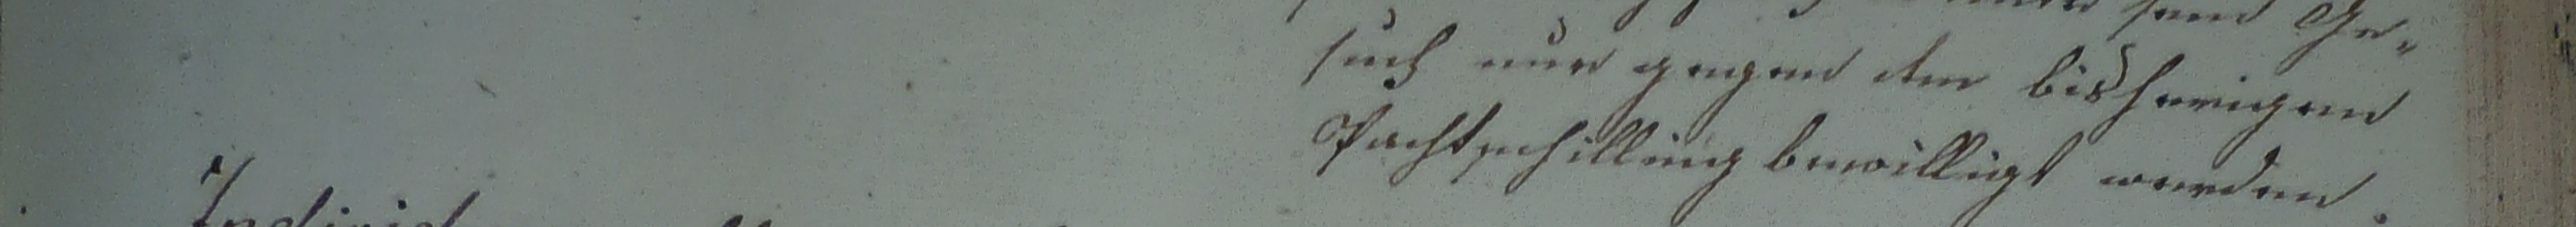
such nur gegen den bisherigen
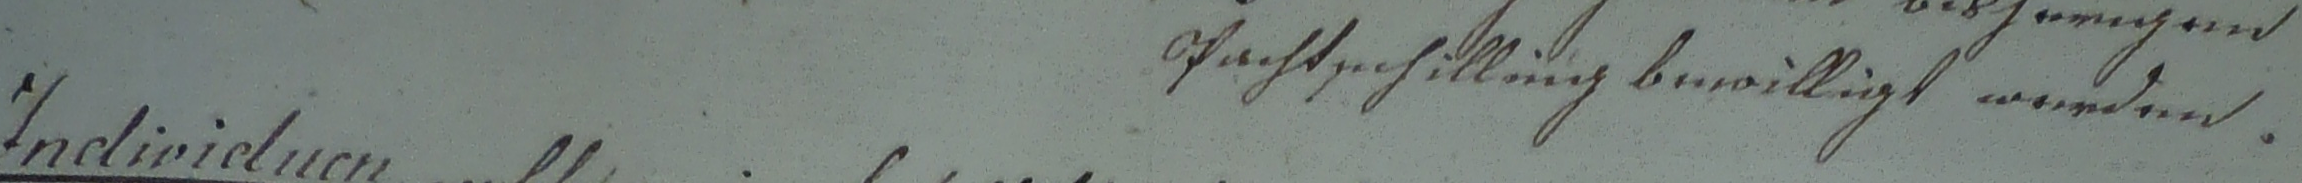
Pachtschilling bewilligt werden.
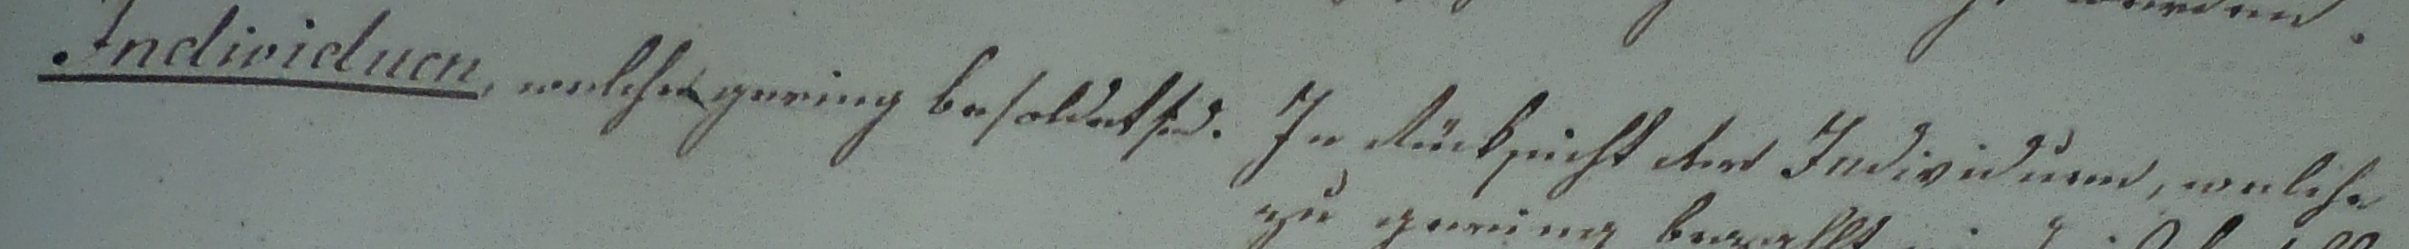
Individuen, welche gering besoldet sind. In Rücksicht der Individuen, welche
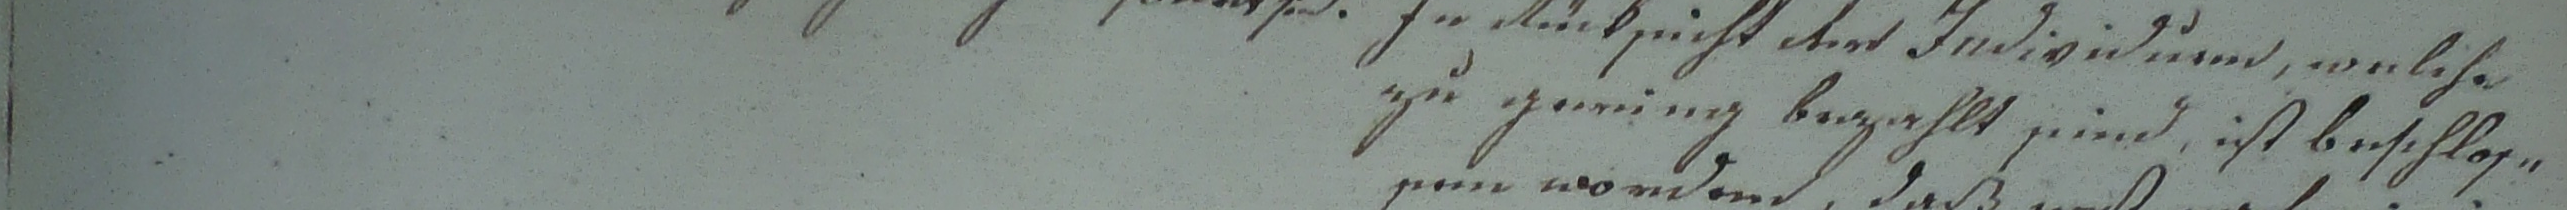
zu gering bezahlt sind, ist beschlos¬
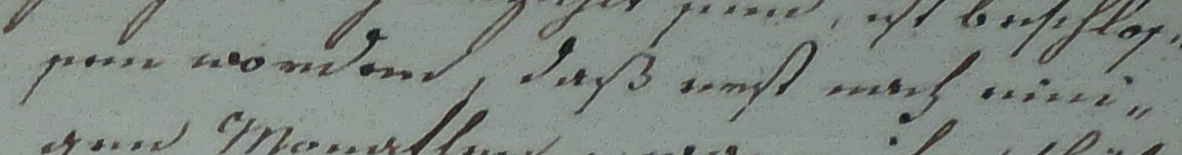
sen worden, daß erst nach eini¬
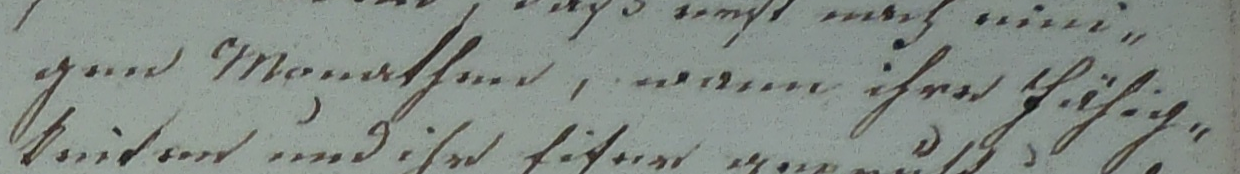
gen Monathen, wann ihre Fähig¬
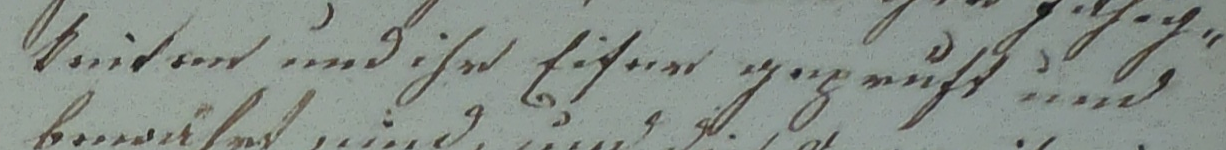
keiten und ihr Eifer geprüft und
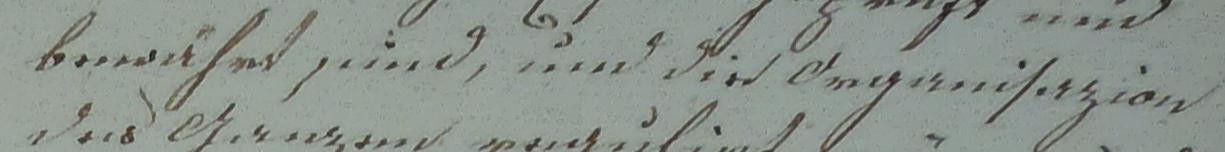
bewährt sind, und die Organisazion
